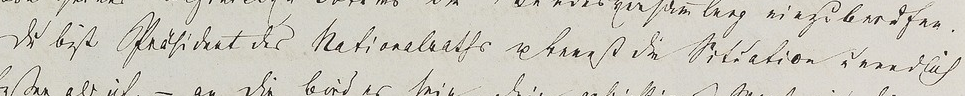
Du bist Präsident des Nationalraths & kennst die Situation unendlich
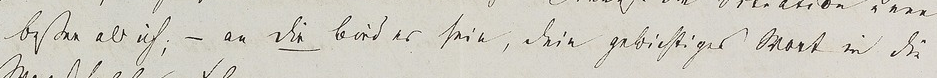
beßer als ich; – an Dir wird es sein, Dein gewichtiges Wort in die
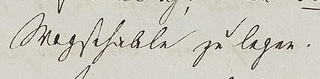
Wagschaale zu legen.
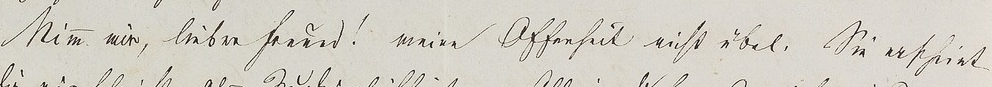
Nimm mir, lieber Freund! meine Offenheit nicht übel. Sie erscheint
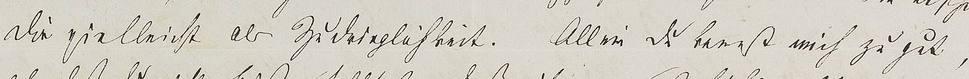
Dir vielleicht als Zudringlichkeit. Allein Du kennst mich zu gut,
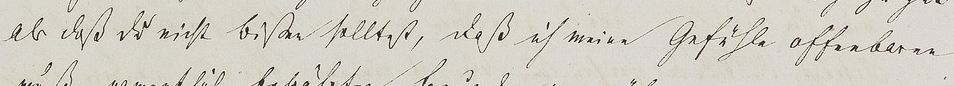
als daß Du nicht wißen solltest, daß ich meine Gefühle offenbaren
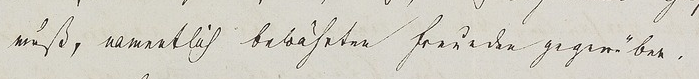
muß, namentlich bewährten Freunden gegenüber.
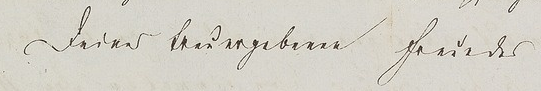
deines treuergebenen Freundes
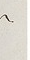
Frey.
